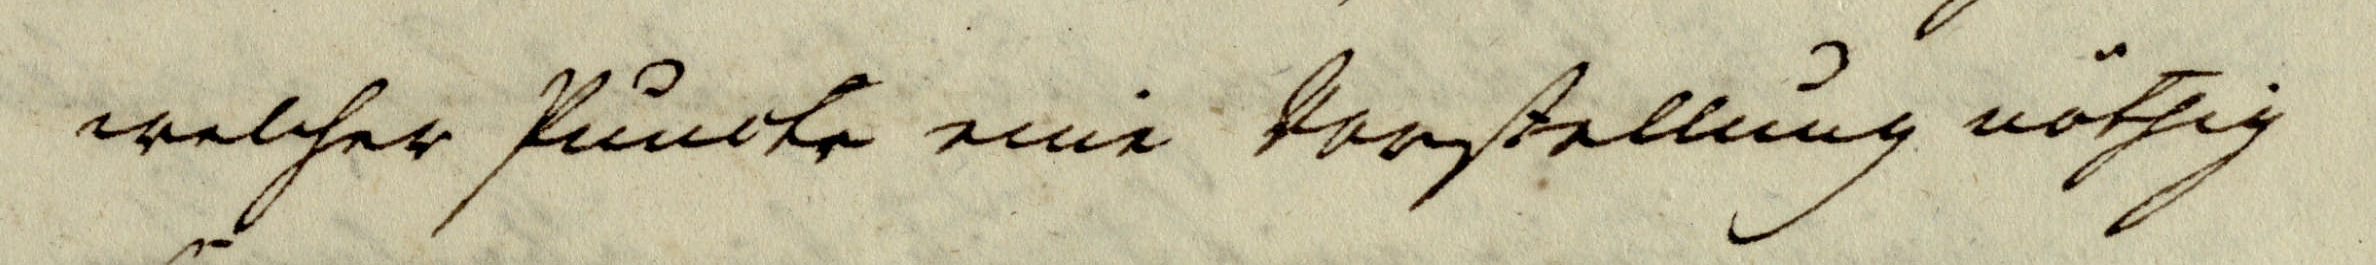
welcher Puncte eine Vorstellung nöthig
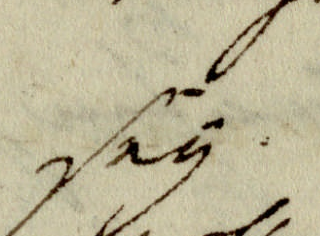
seÿ.
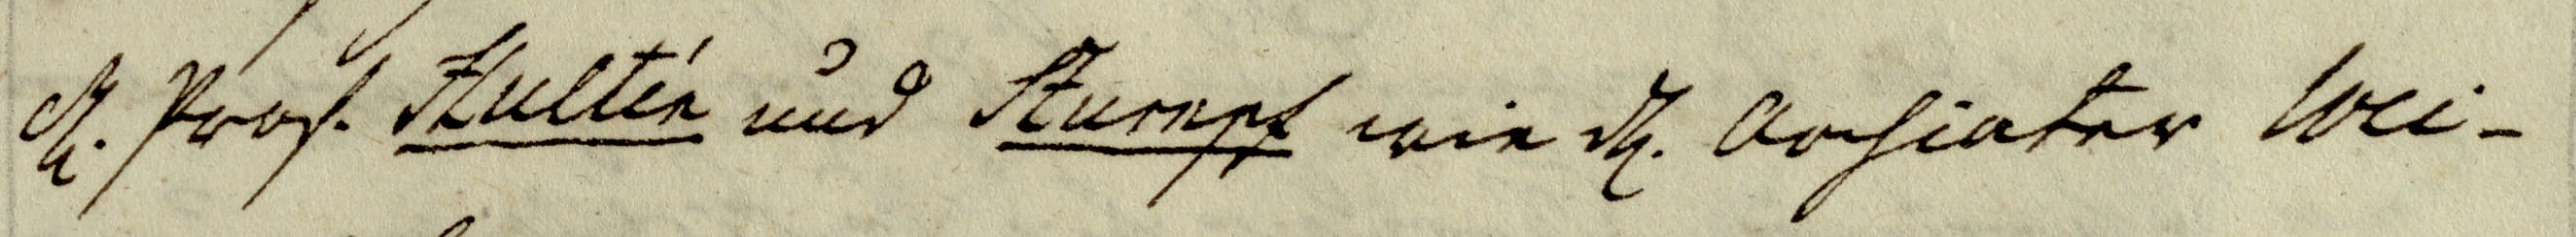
dh. Prof. Hultén und Stumpf wie dh. Archiater Wei¬
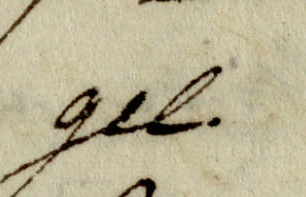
gel.
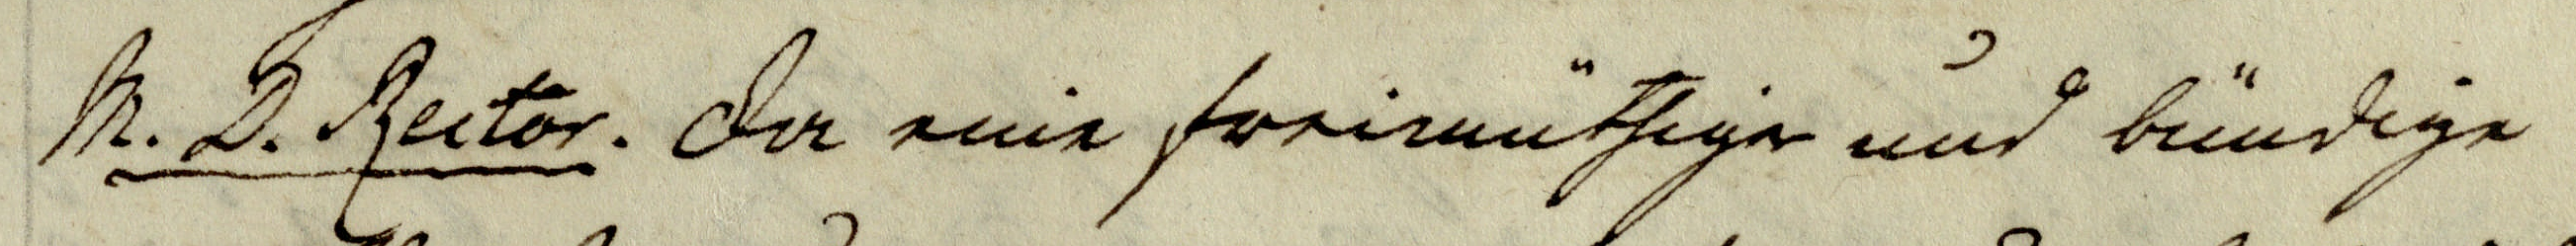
M. D. Rector. Da eine freimüthige und bündige
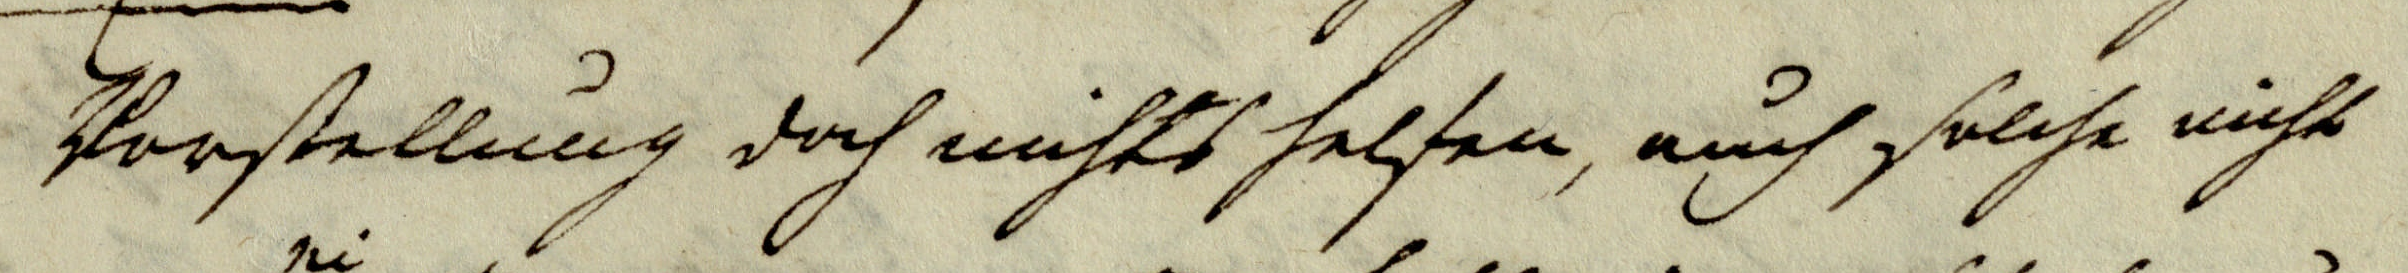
Vorstellung doch nichts helfen, auch solche nicht
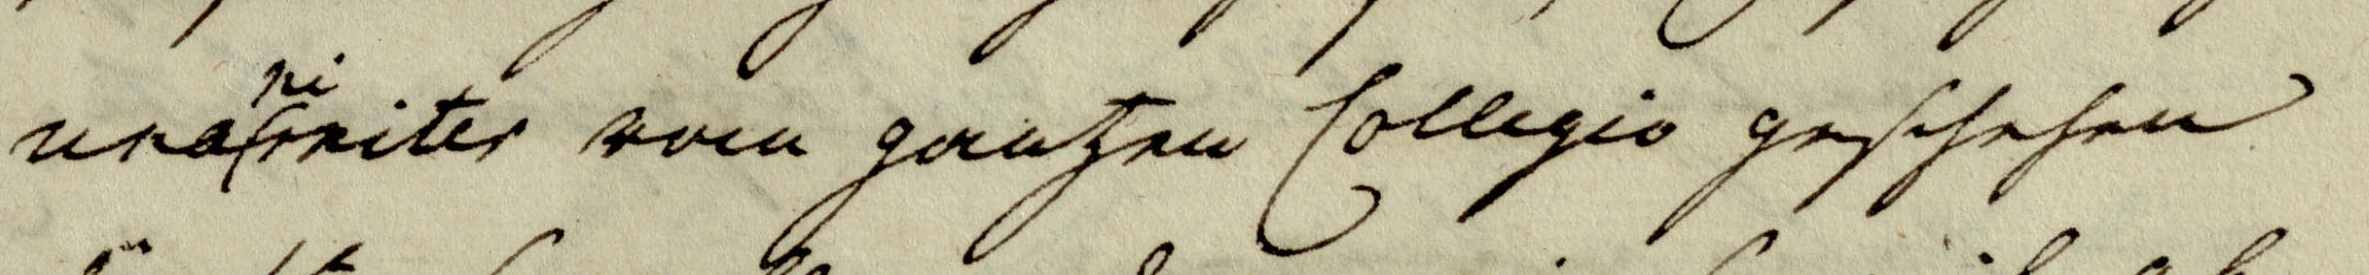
unanimiter vom gantzen Collegio geschehen
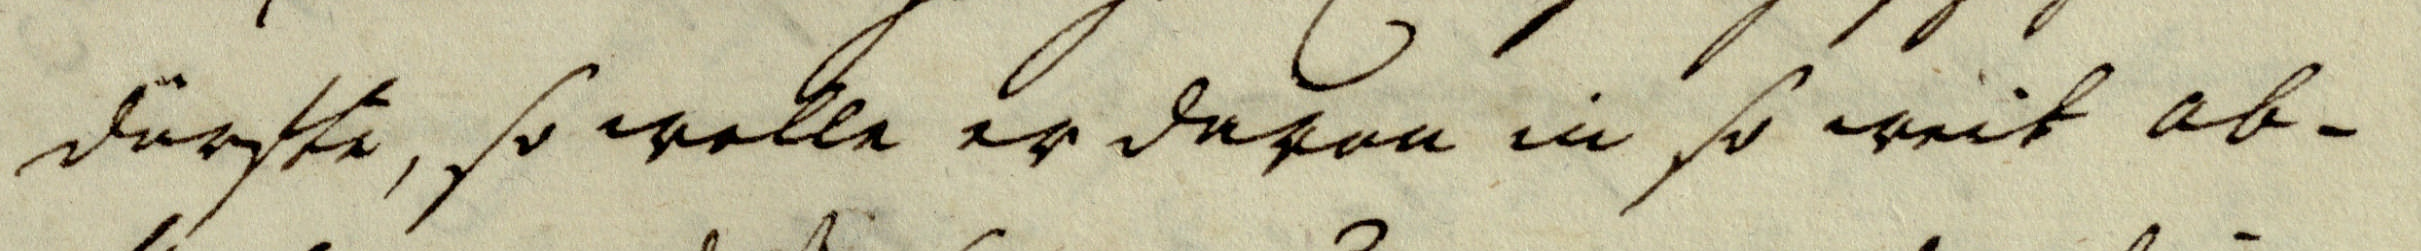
dürfte, so wolle er davon in so weit ab¬
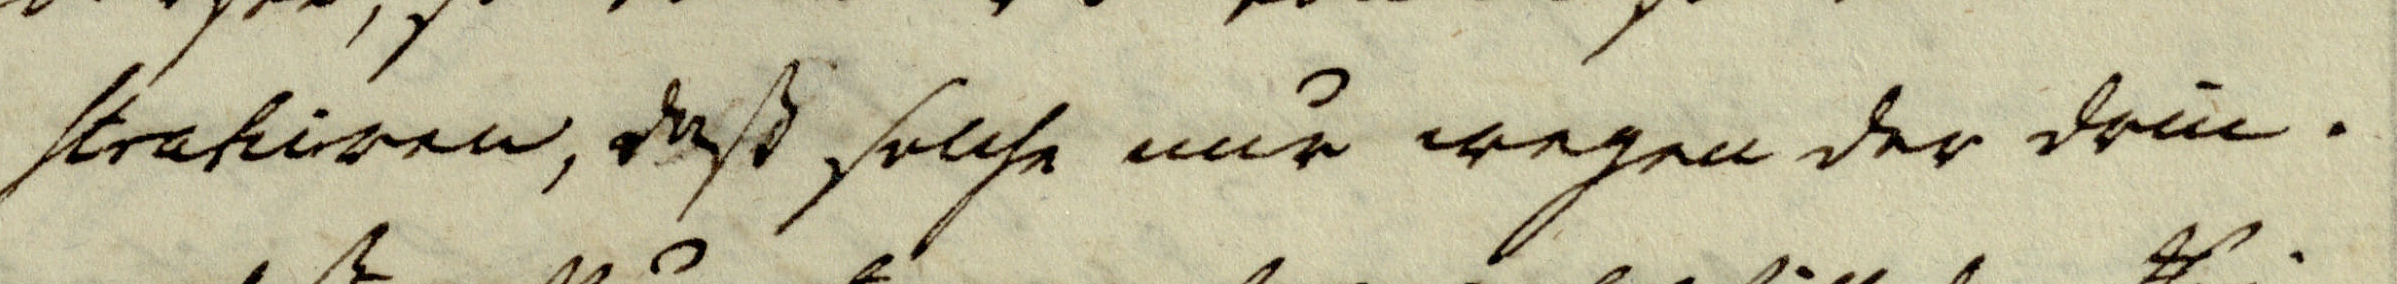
strahiren, daß solche nur wegen der drin¬
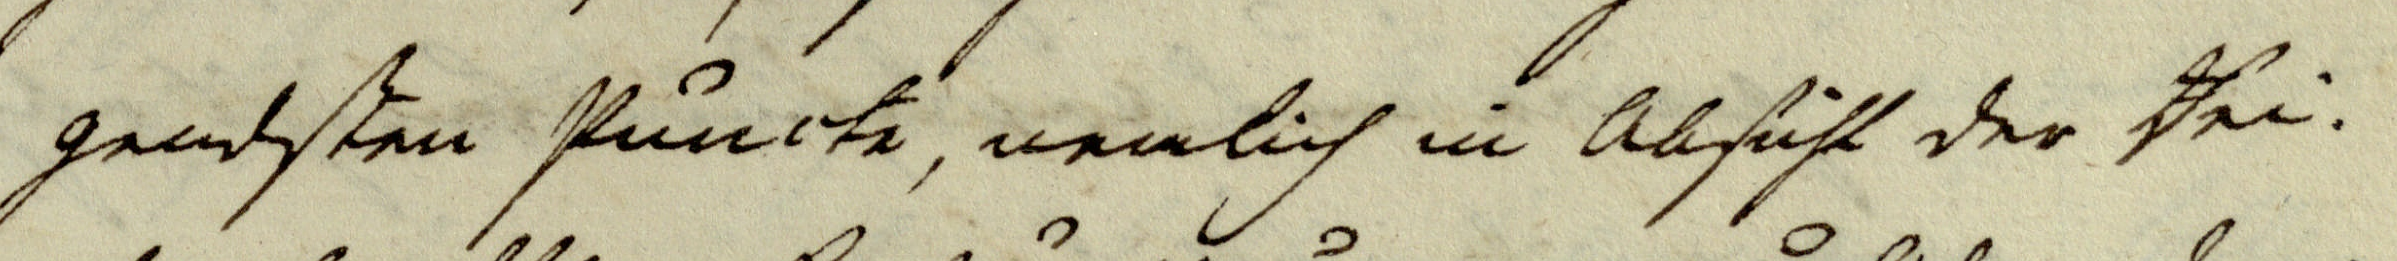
gendsten Puncte, nemlich in Absicht der Rei¬
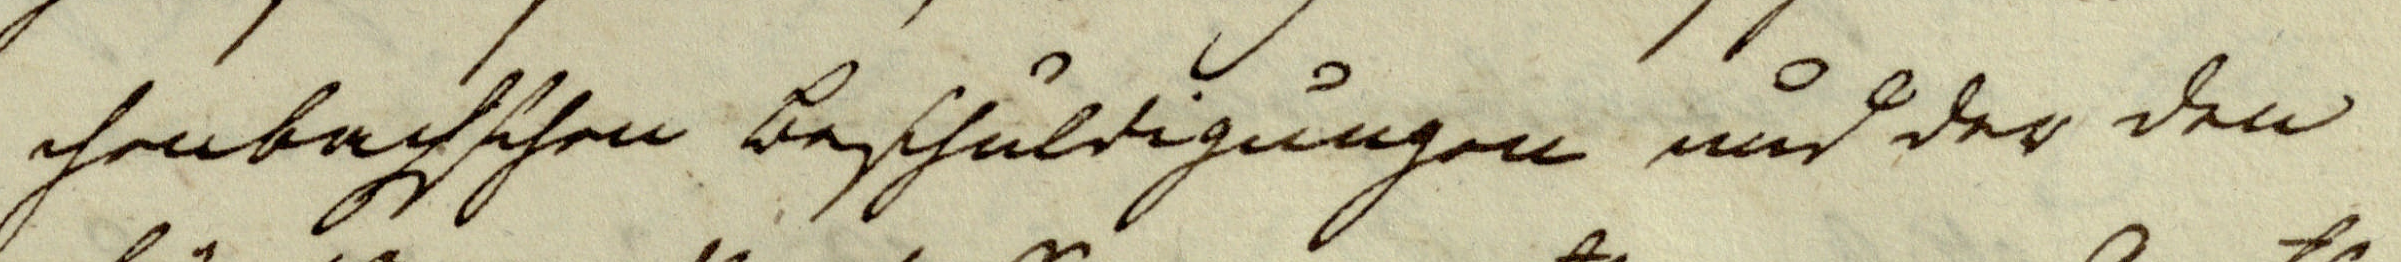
chenbachschen Beschuldigungen und der den
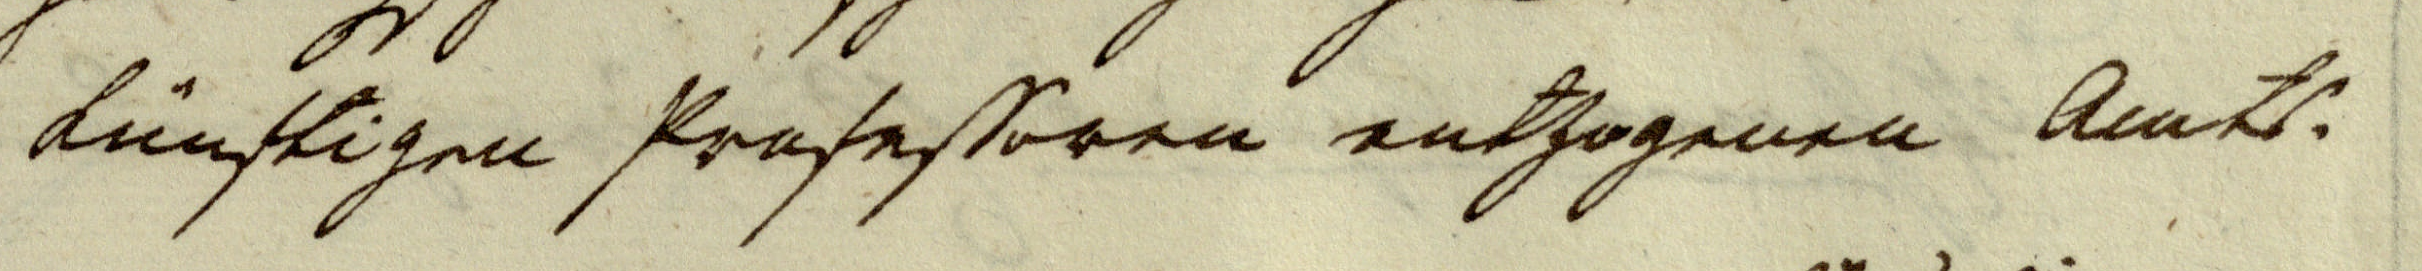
künftigen Professoren entzogenen Amts¬
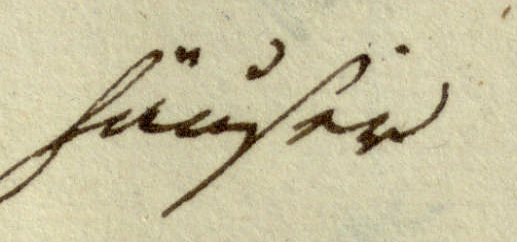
häuser
